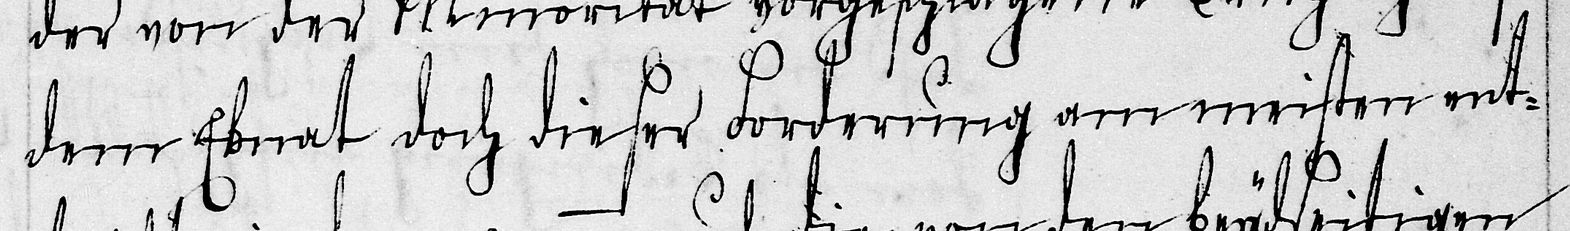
dem Ebnat doch dieser Forderung am meisten ent¬
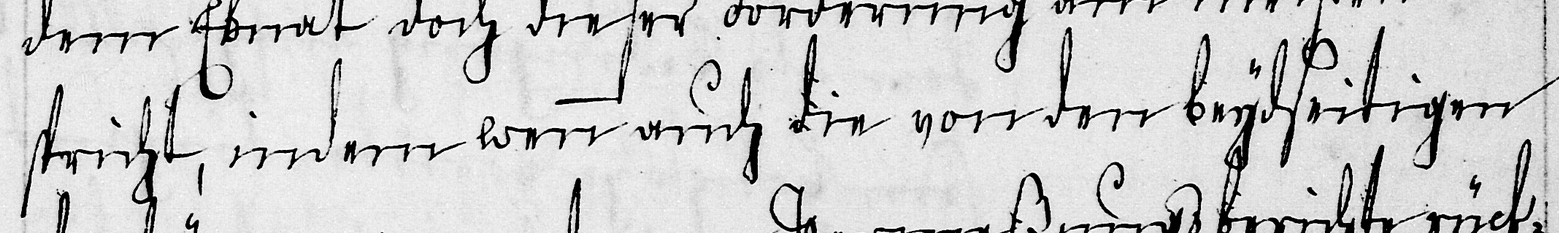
spricht, indem wenn auch die von den beydseitigen
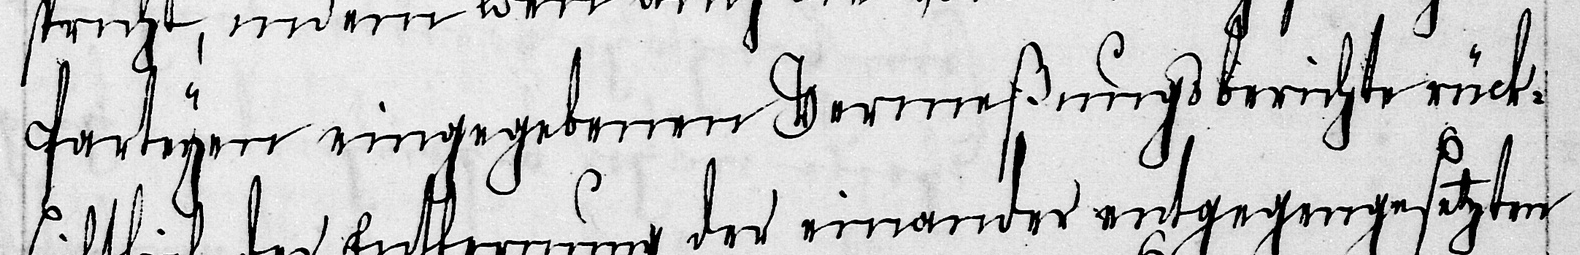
Parteyen eingegebenen Vermeßungsberichte rück¬
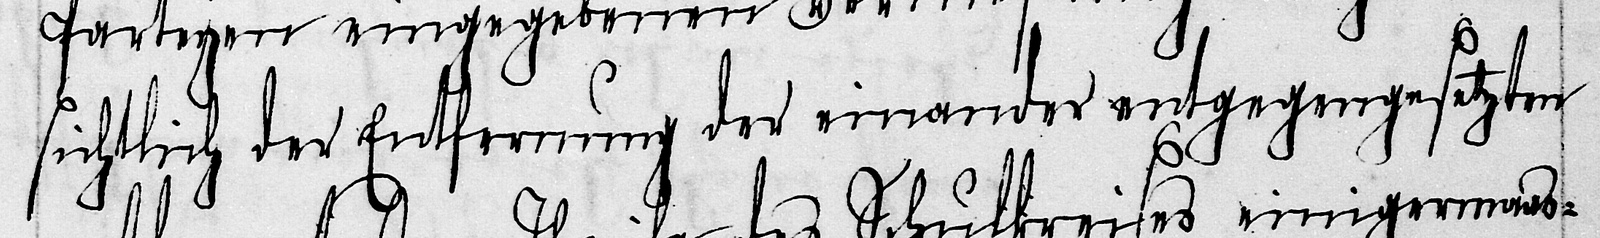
sichtlich der Entfernung der einander entgegengesetzten
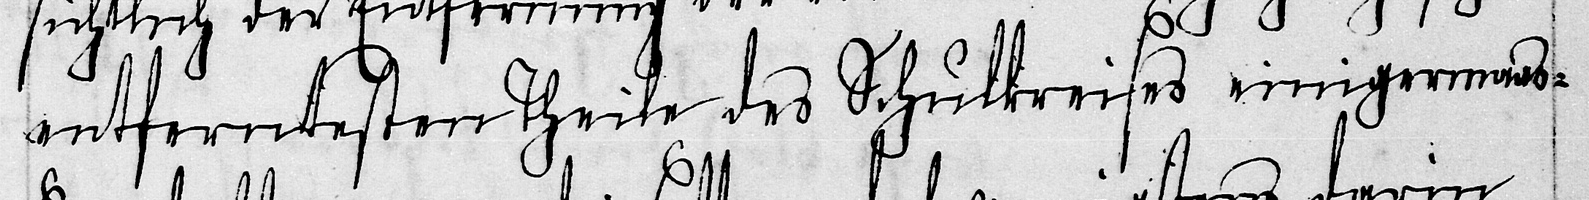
entferntesten Theile des Schulkreises einigermaa¬
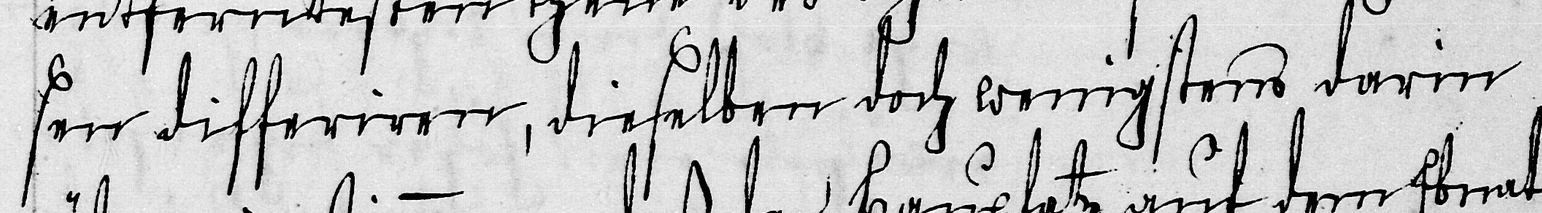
ßen differiren, dieselben doch wenigstens darin
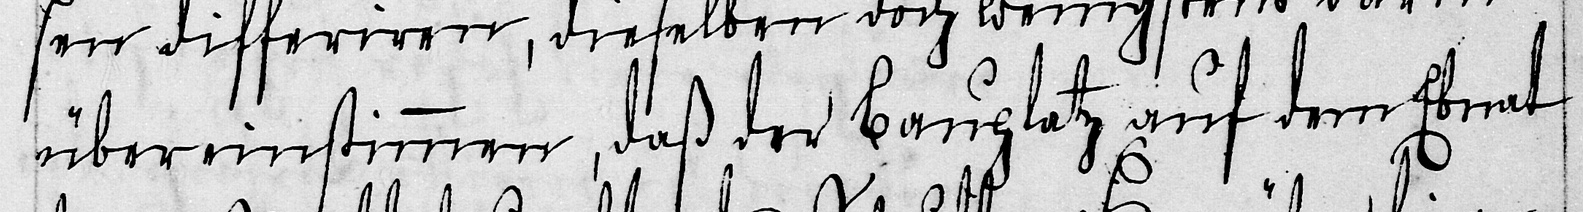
übereinstimmen, daß der Bauplatz auf dem Ebnat
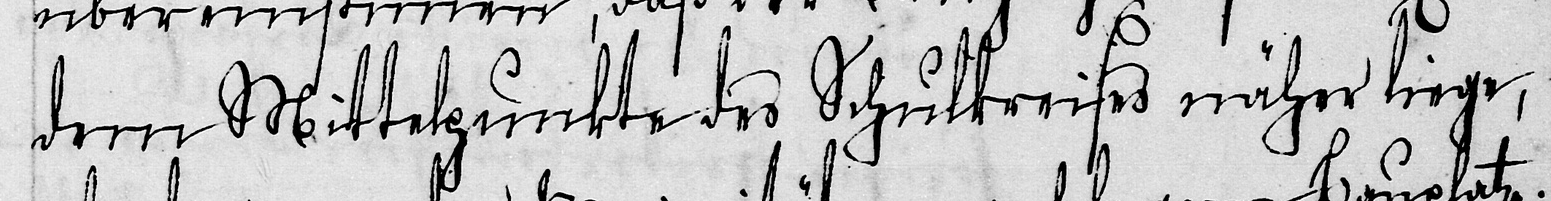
dem Mittelpunkte des Schulkreises näher liege,
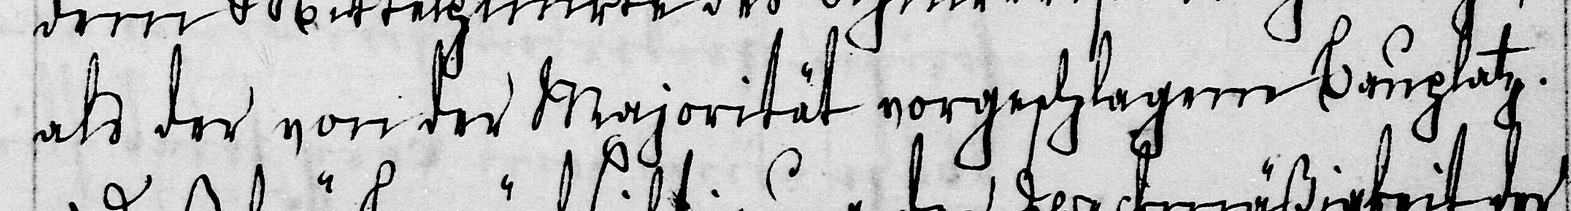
als der von der Majorität vorgeschlagene Bauplatz.
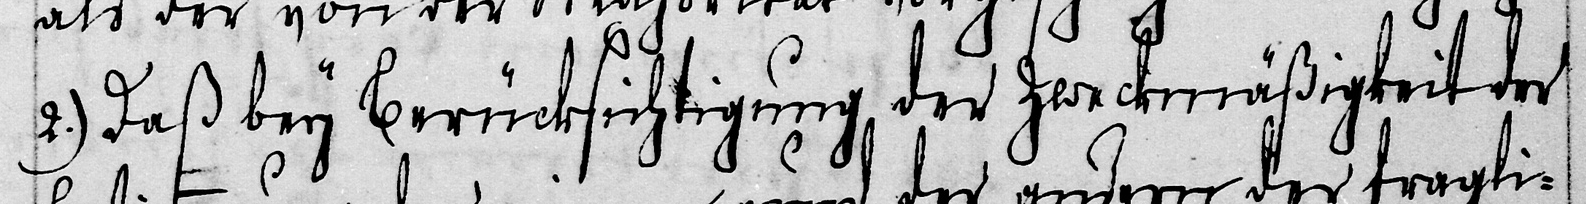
2.) Daß bey Berücksichtigung der Zweckmäßigkeit der
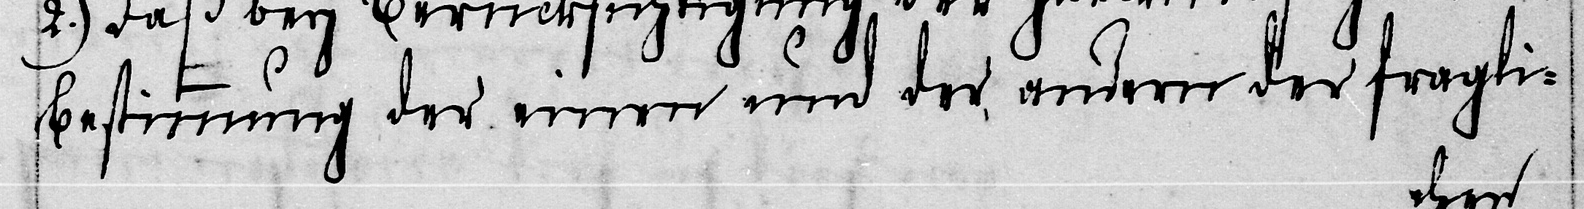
Bestimmung der einen und der andern der fragli-
